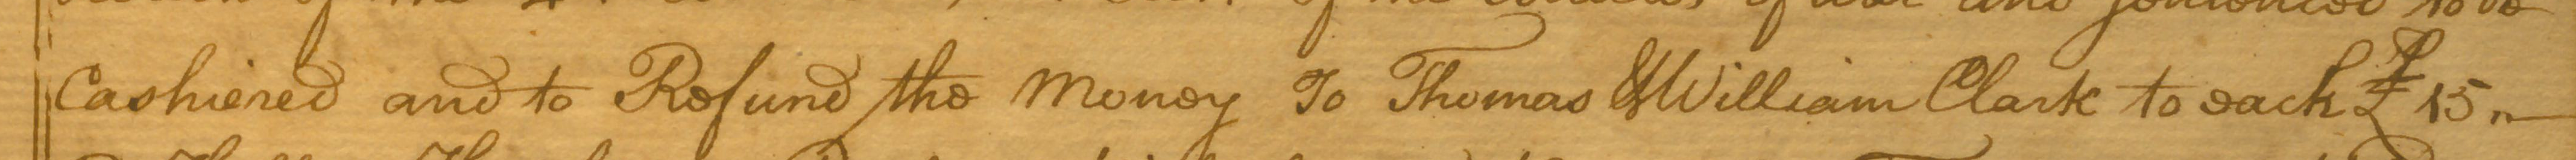cashiered and to Refund the money To Thomas & William Clark to each £15-
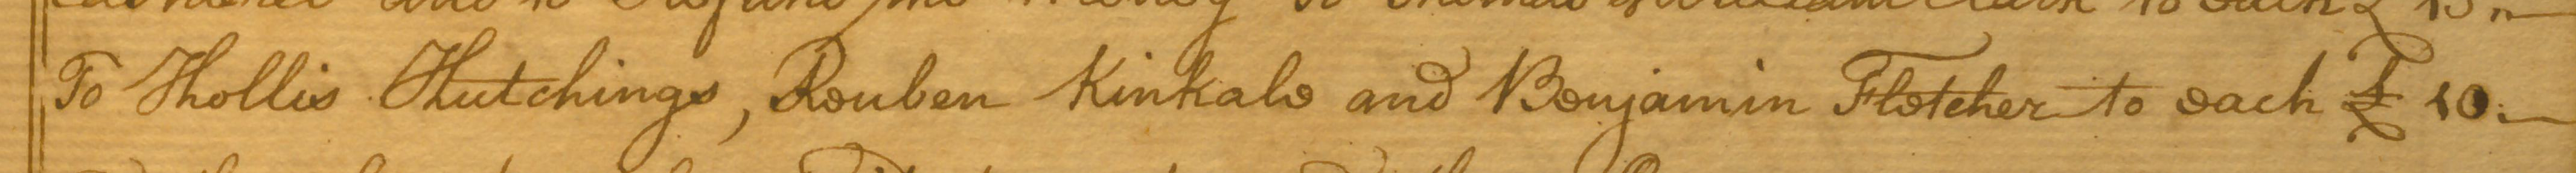To Hollis Hutchings, Reuben Kinkale and Benjamin Fletcher to each £10-
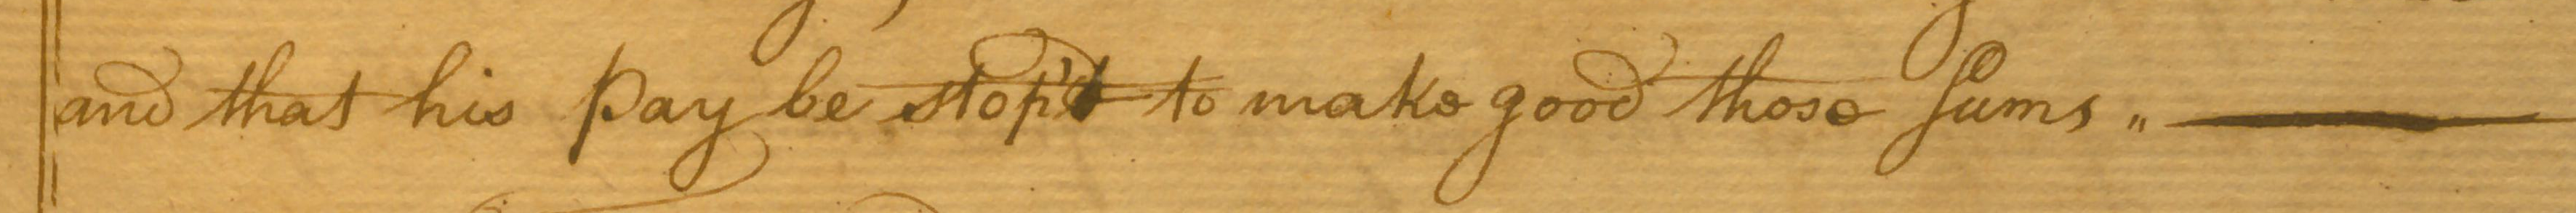and that his pay be stop'd to make good these sums.-
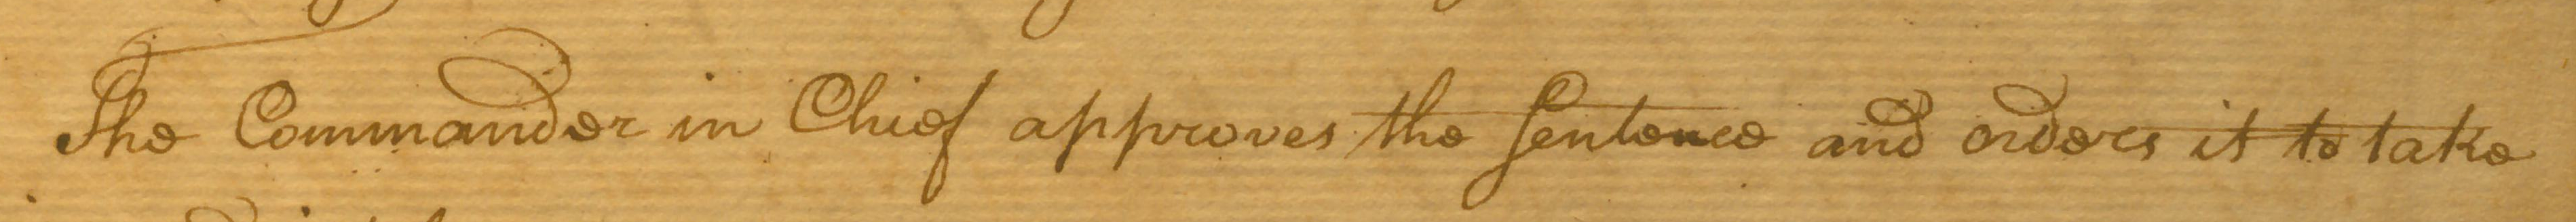The Commander in Chief approves the sentence and orders it to take
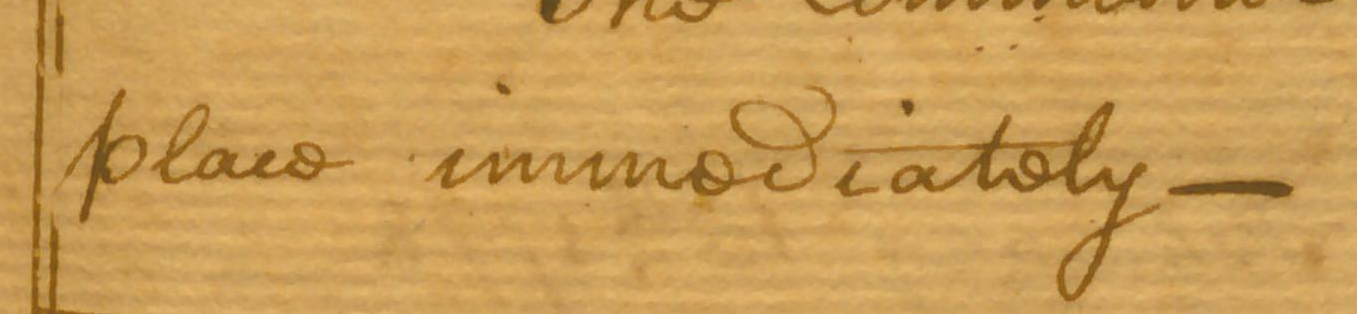place immediately-
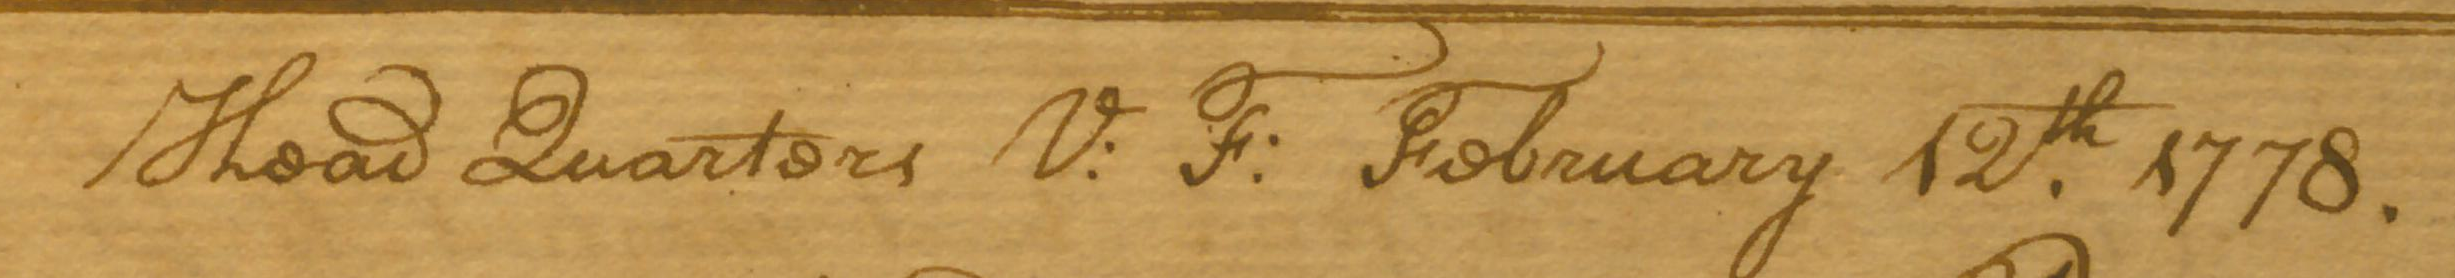Head Quarters V: F: February 12^th. 1778.
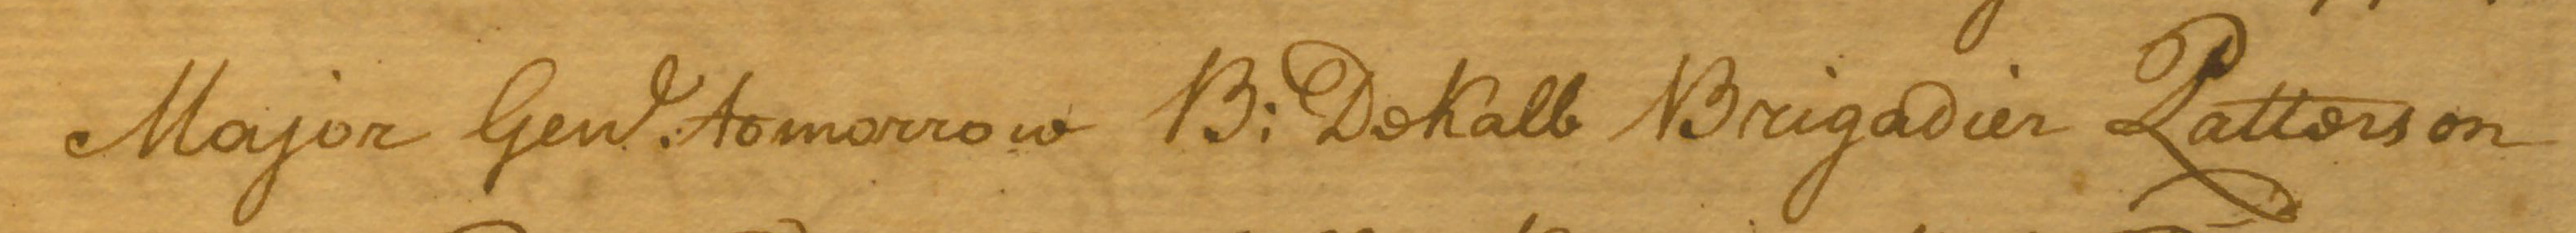Major Gen^l. tomorrow B: DeKalb Brigadier Patterson
